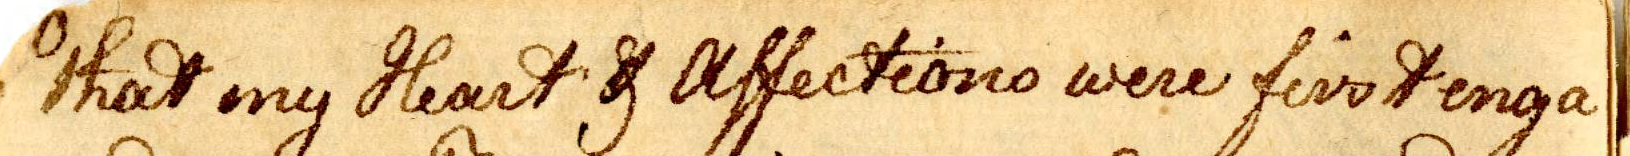that my Heart & Affections were first enga
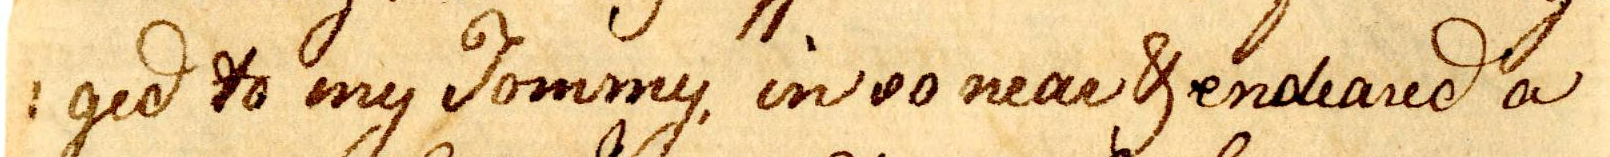-ged to my Tommy, in so near & endeared a
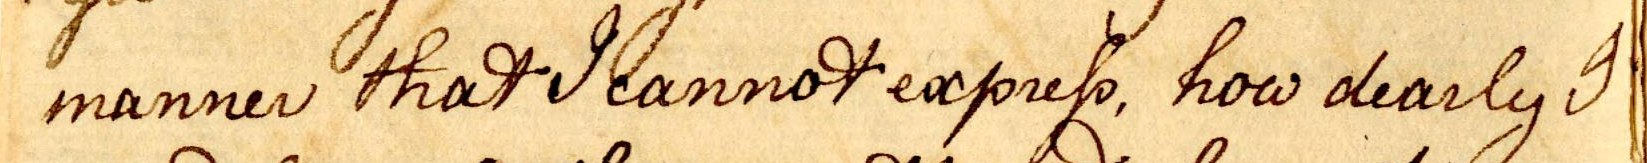manner that I cannot express, how dearly I
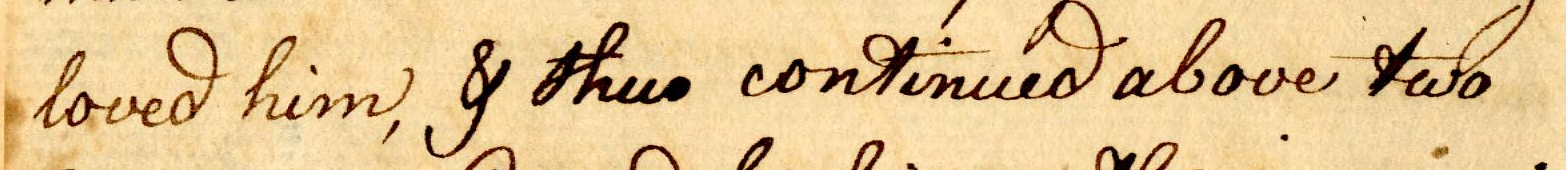loved him, & thus continued above two
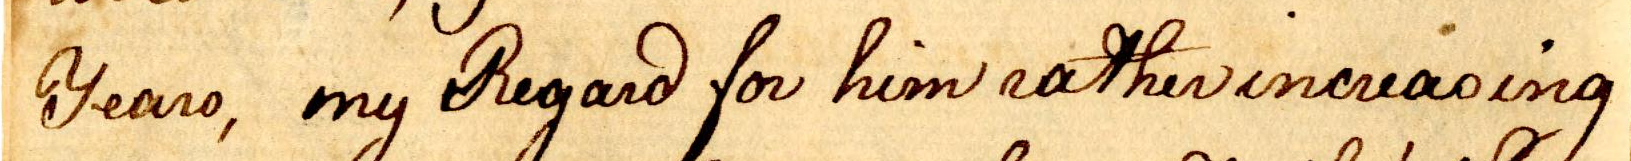Years, my Regard for him rather increasing
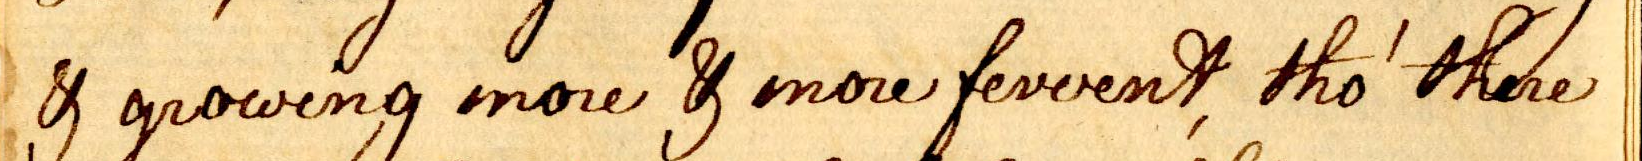& growing more & more fervent tho' there
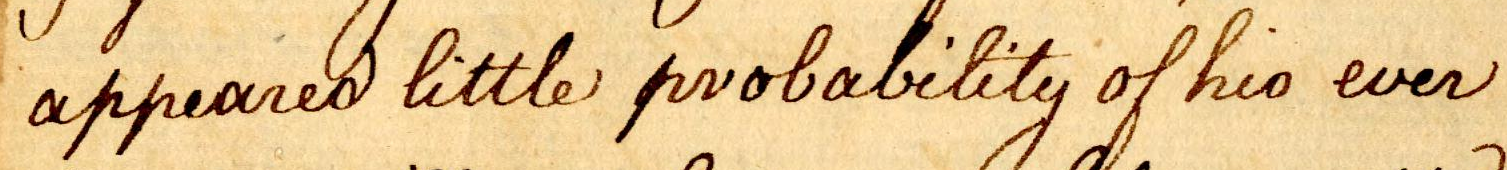appeared little probability of his ever
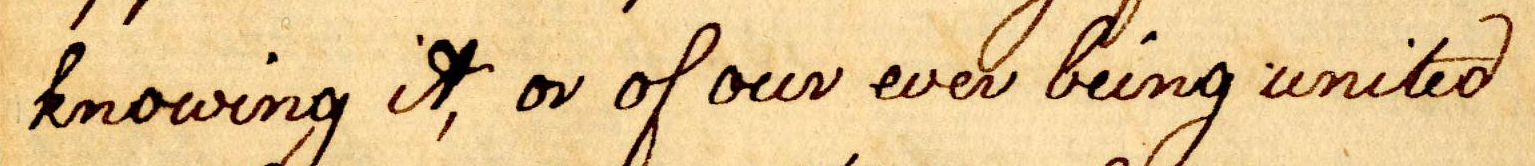knowing it, or of our ever being united
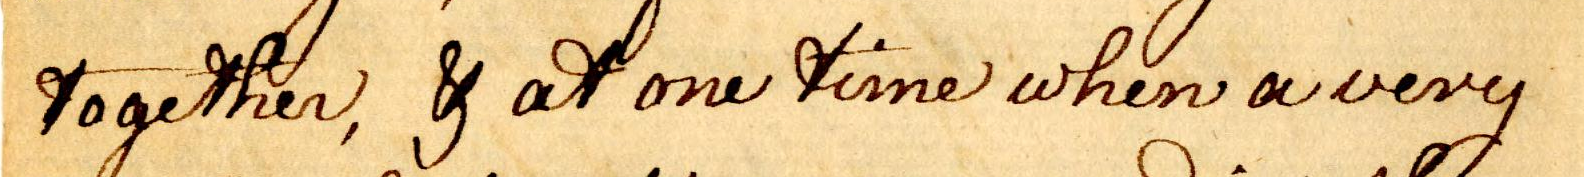together, & at one time when a very
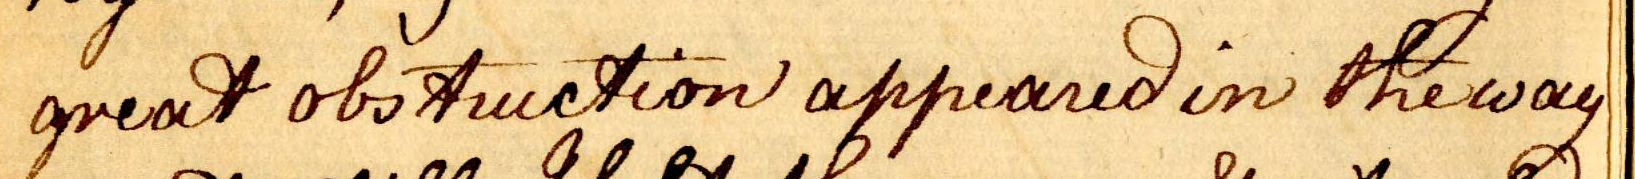great obstruction appeared in the way
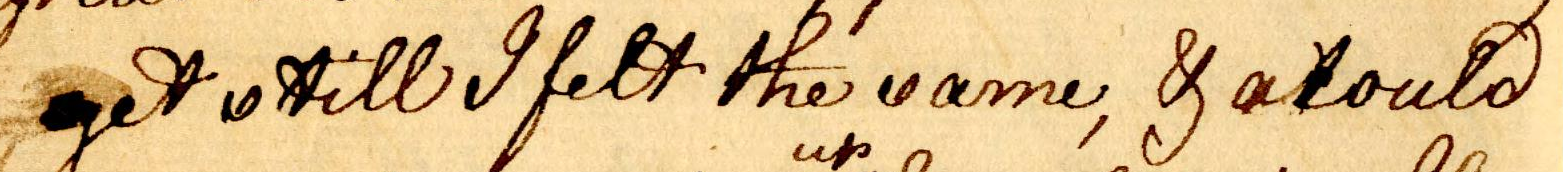yet still I felt the same, & a Could
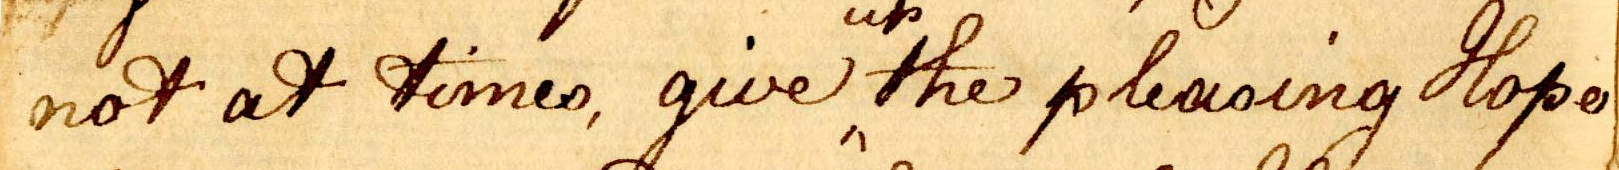not at times, give ^up the pleasing Hope
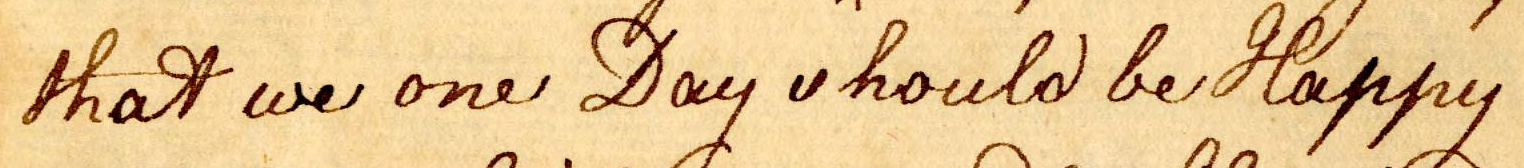that we one Day should be Happy
